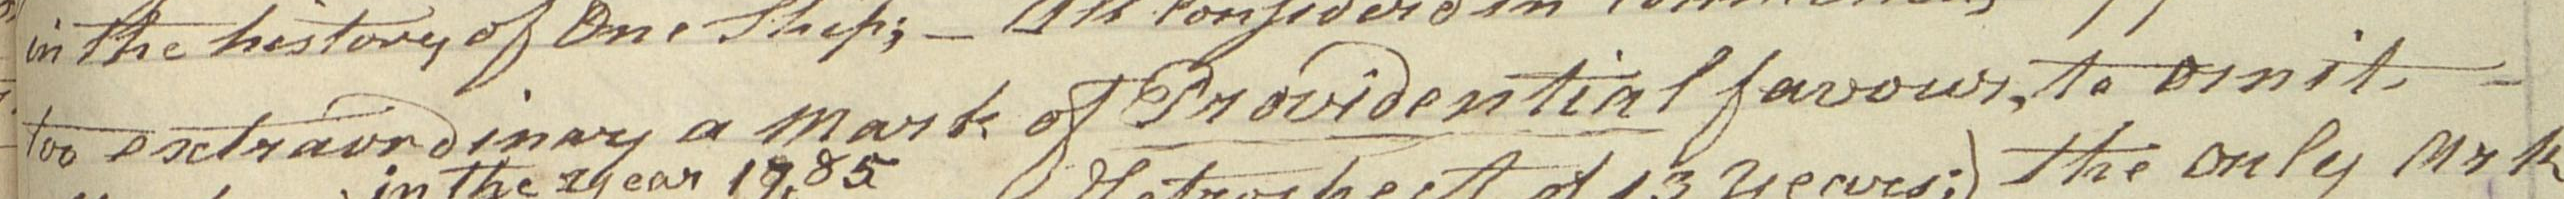too extraordinary a mark of Providential favour, to omit
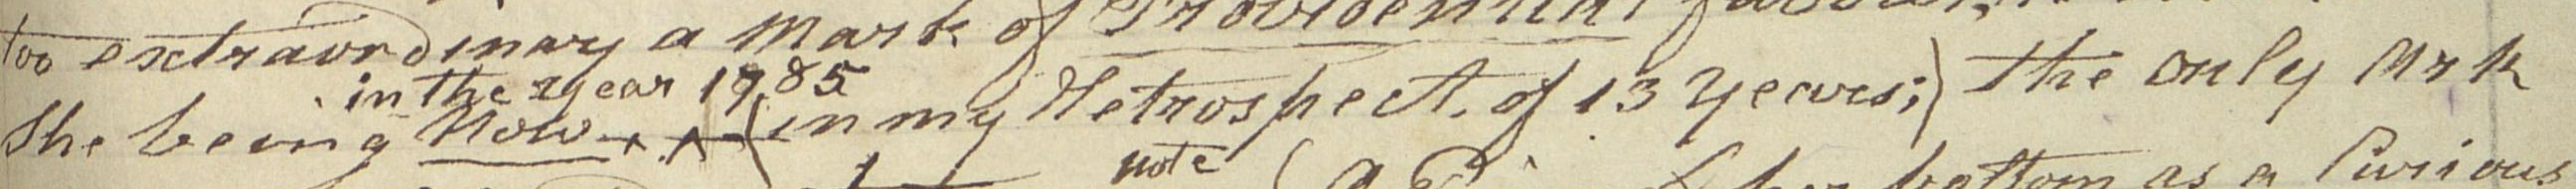she being now ^ ^ (in my retrospect of 13 years;) the only ask
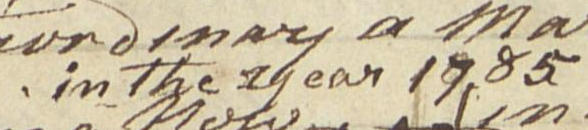in the year 1785
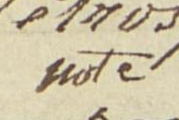note
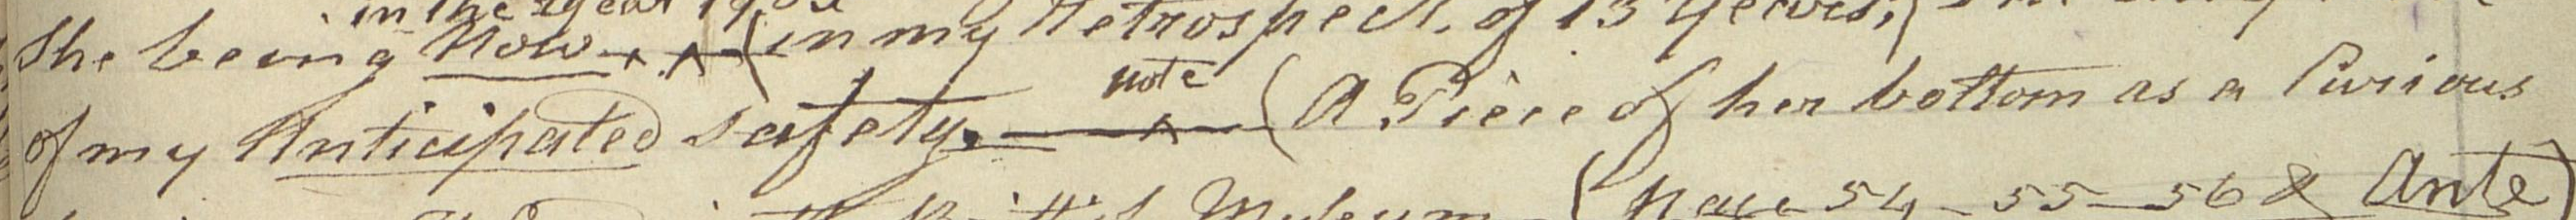of my Anticipated safety. ^ (A Piece of her bottom as a Curious
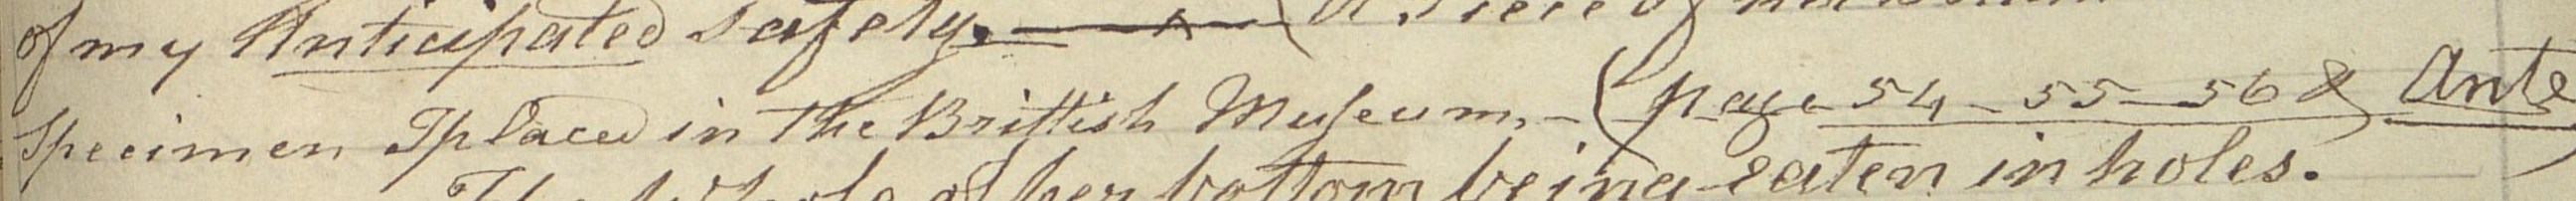Specimen I placed in the Brittish Museum, (page 54, 55, 56 & Ante)
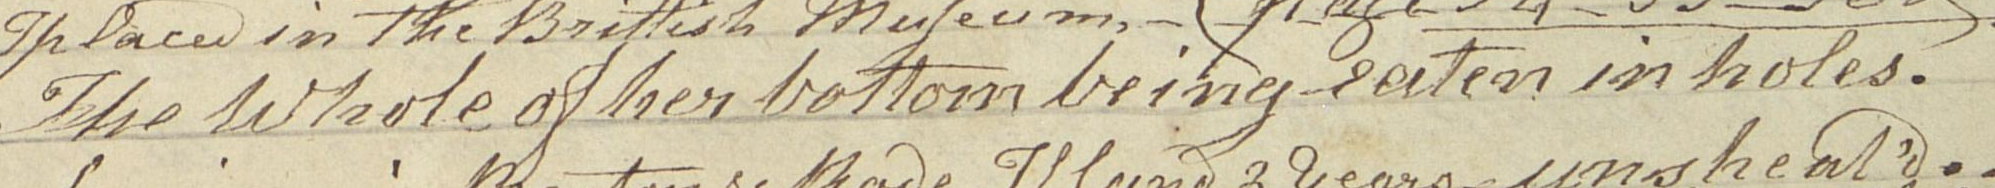The Whole of her bottom being eaten in holes
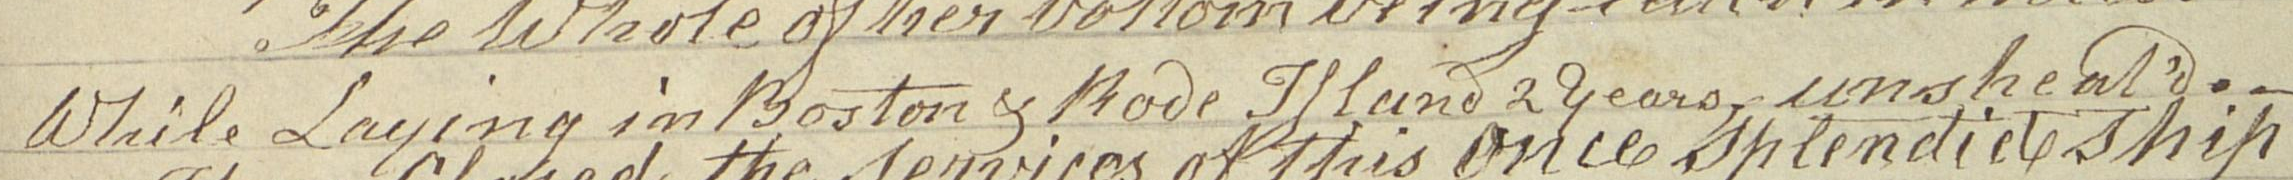While laying in Boston & Rode Island 2 Years, unsheal'd.
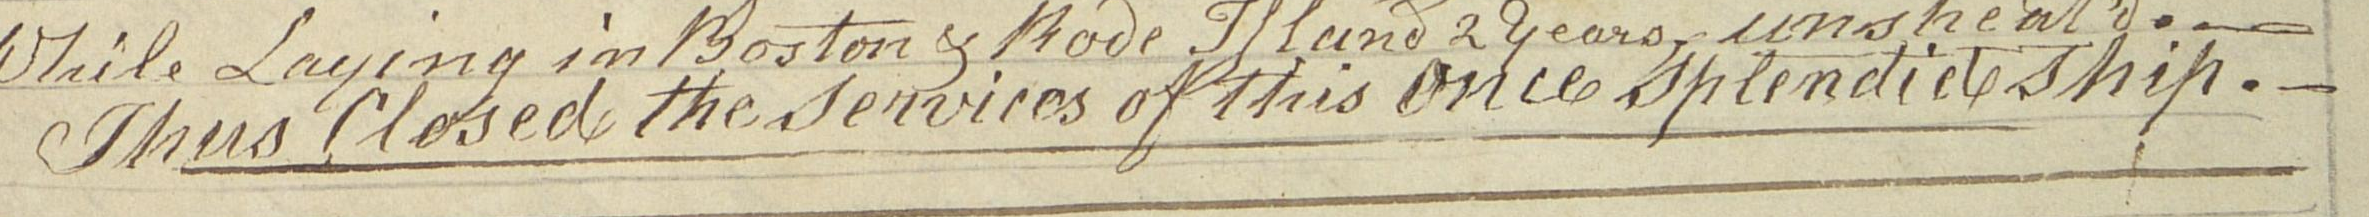Thus closed the services fo this once Splendid Ship.
